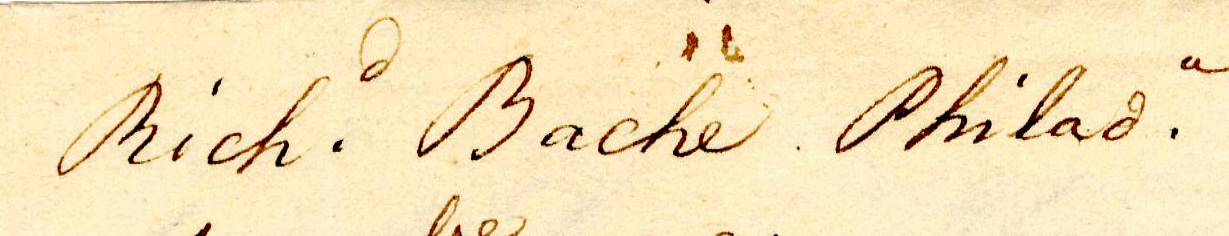Rich^d. Bache Philad^a.
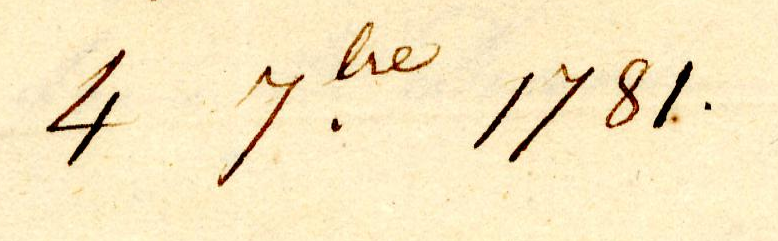4 7^bre. 1781.
